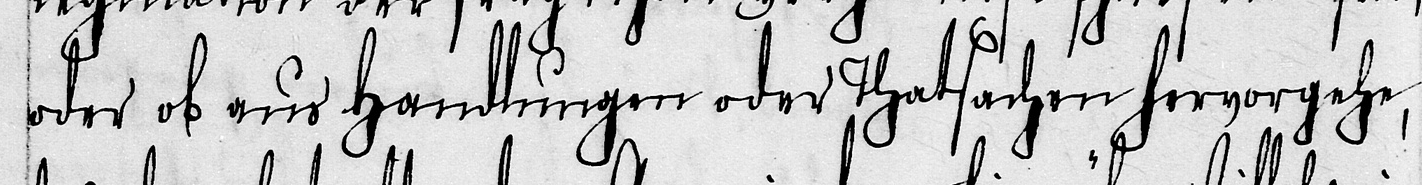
oder ob aus Handlungen oder Thatsachen hervorgehe,
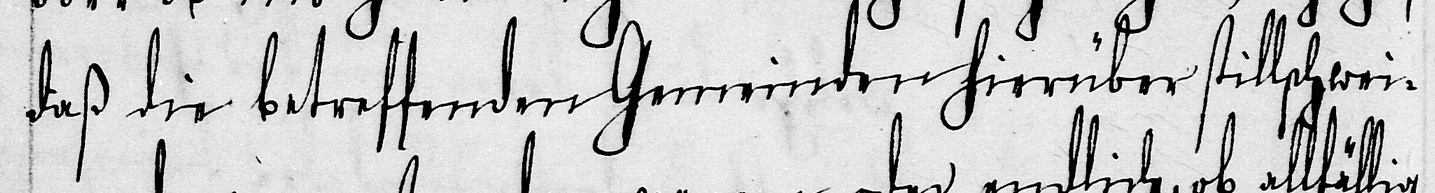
daß die betreffenden Gemeinden hierüber stillschwe¬
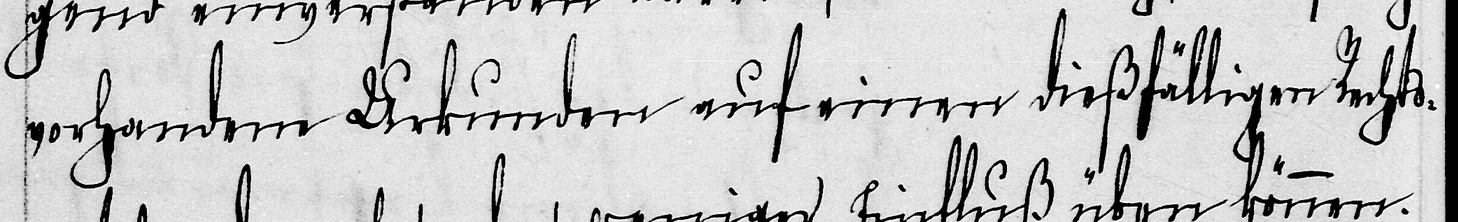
vorhandene Urkunden auf einen dießfälligen Rech¬
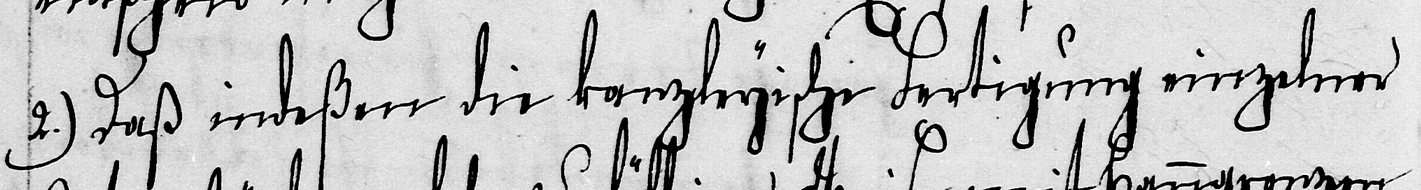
2.) Daß indeßen die kanzleyische Fertigung einzelner
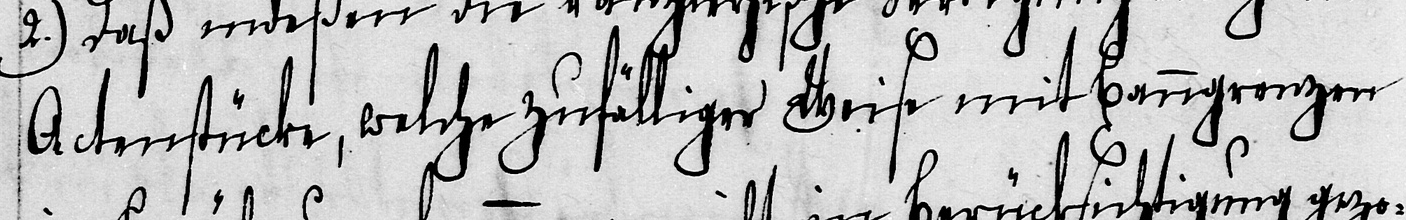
Actenstücke, welche zufälliger Weise mit Banngrenzen
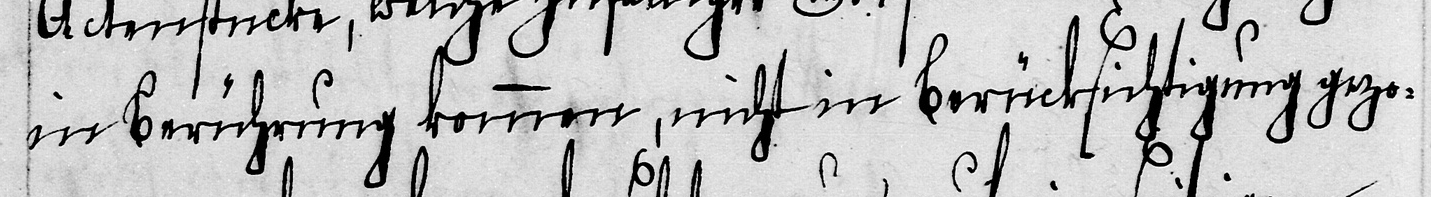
in Berührung kommen, nicht in Berücksichtigung gezo¬
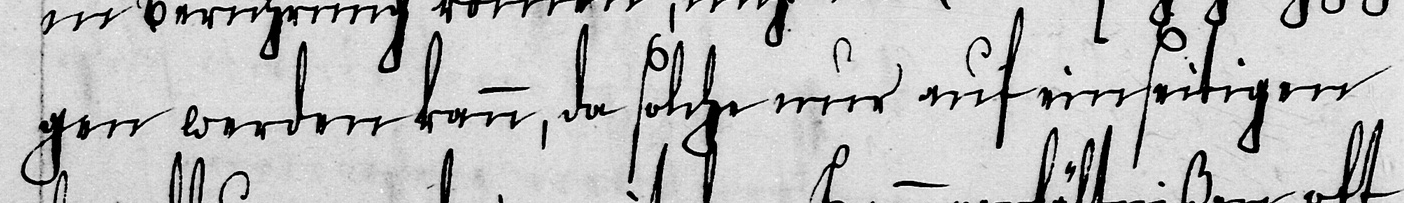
gen werden kann, da solche nur auf einseitigen
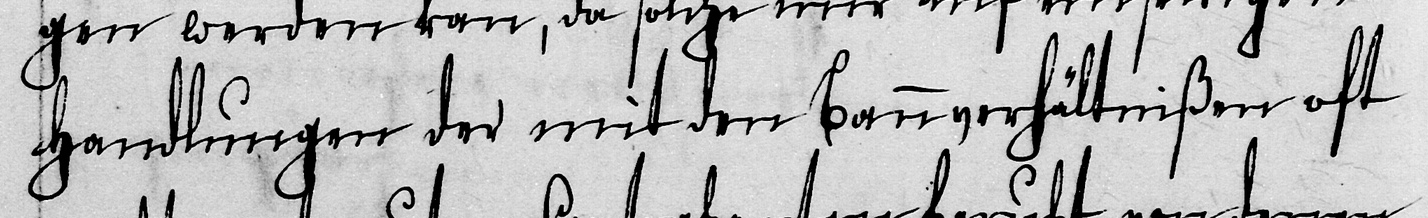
Handlungen der mit den Bannverhältnißen oft
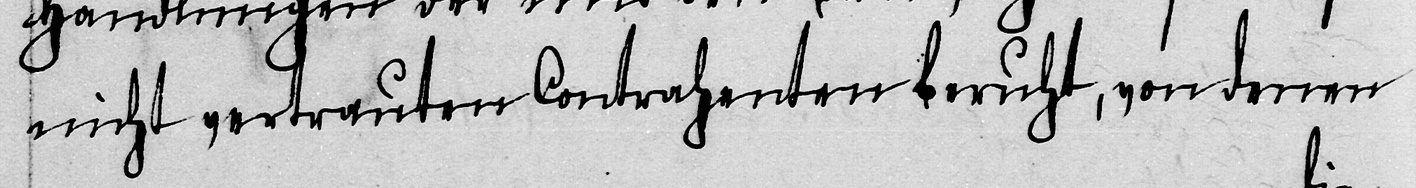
nicht vertrauten Contrahenten beruht, von denen
